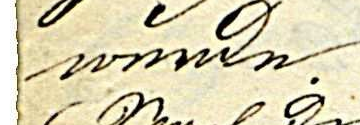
wurde.
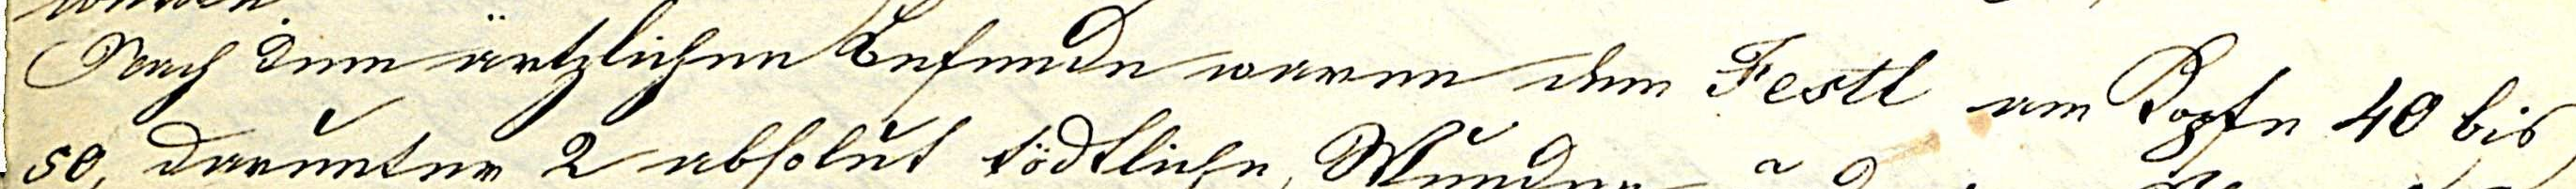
Nach dem ärztlichen Befunde waren dem Festl am Kopfe 40 bis
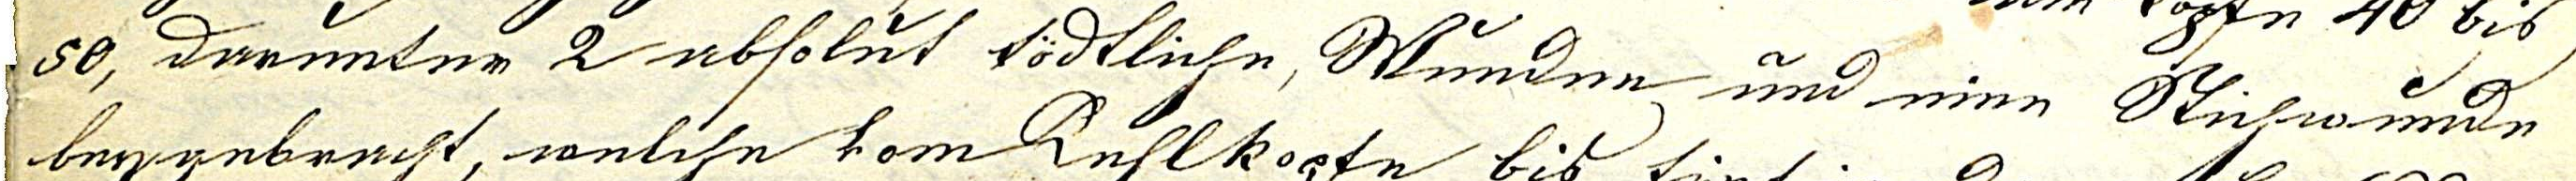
50, darunter 2 absolut tödtliche, Wunden und eine Stichwunde
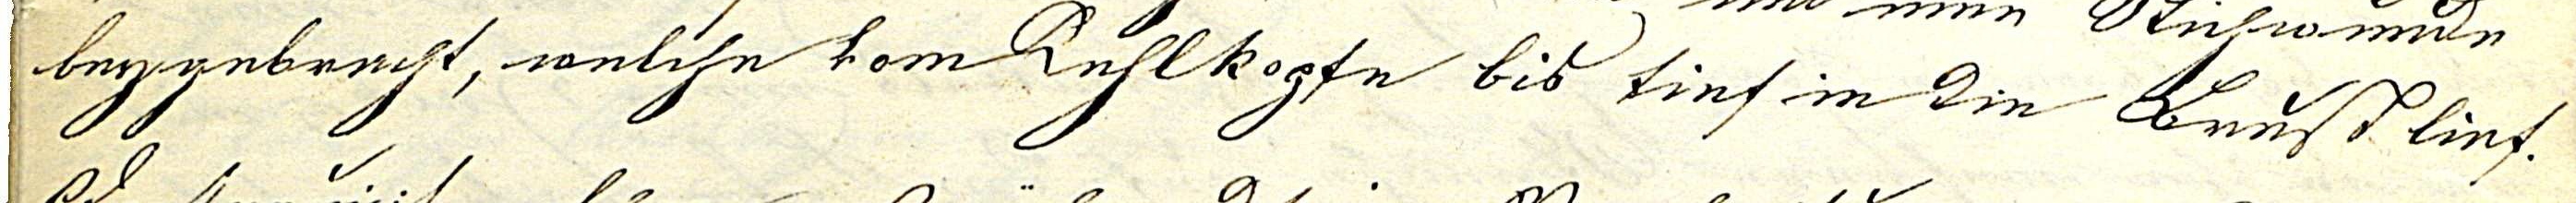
beygebracht, welche vom Kehlkopfe bis tief in die Brust lief.
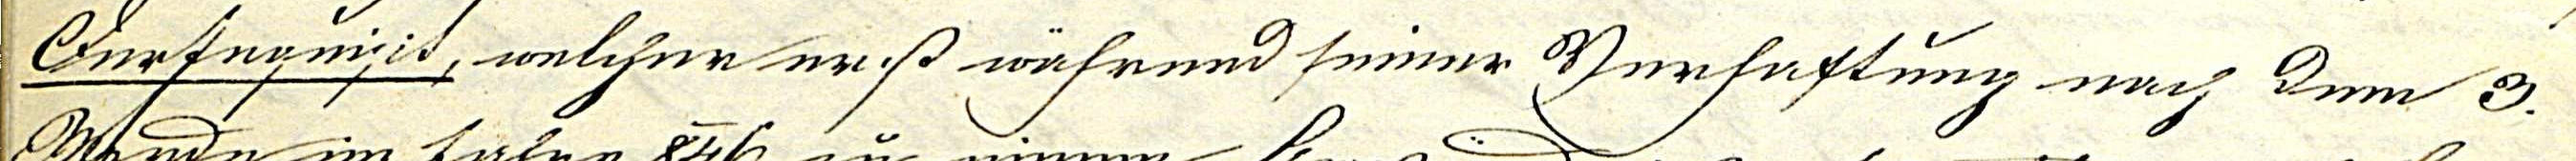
Der Inquisit, welcher erst während seiner Verhaftung nach dem 3.
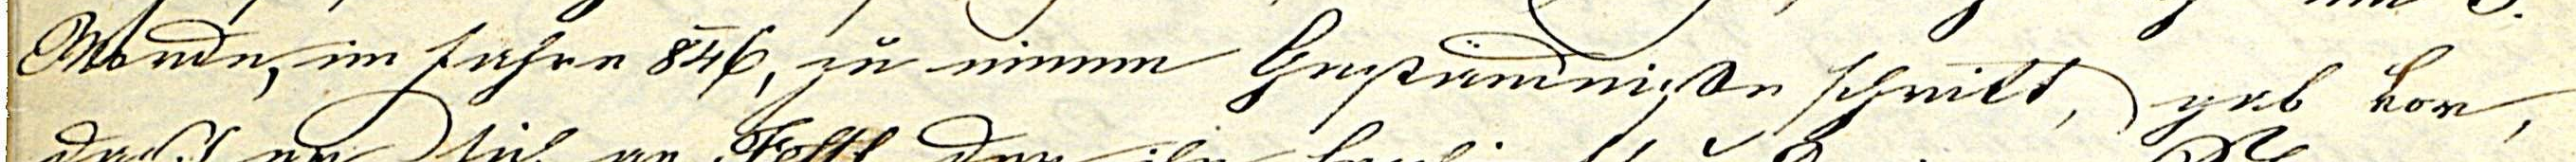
Morde, im Jahre 846, zu einem Geständniße schritt, gab vor,
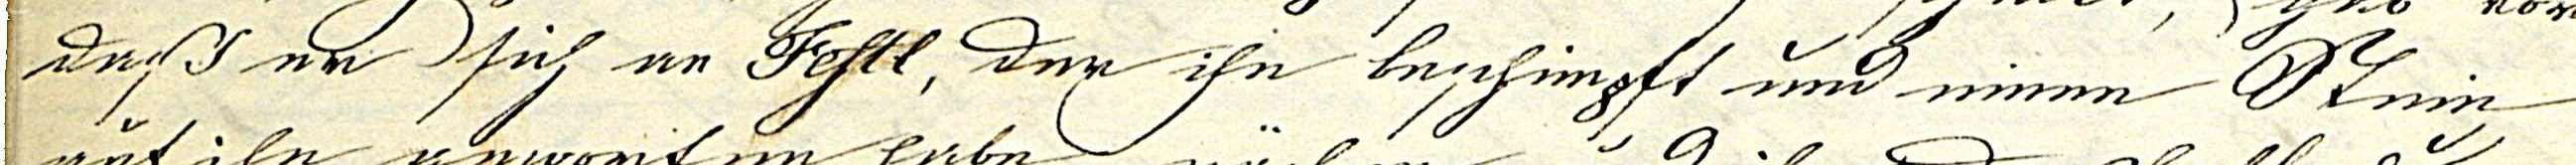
daß er sich an Festl, der ihn beschimpft und einen Stein
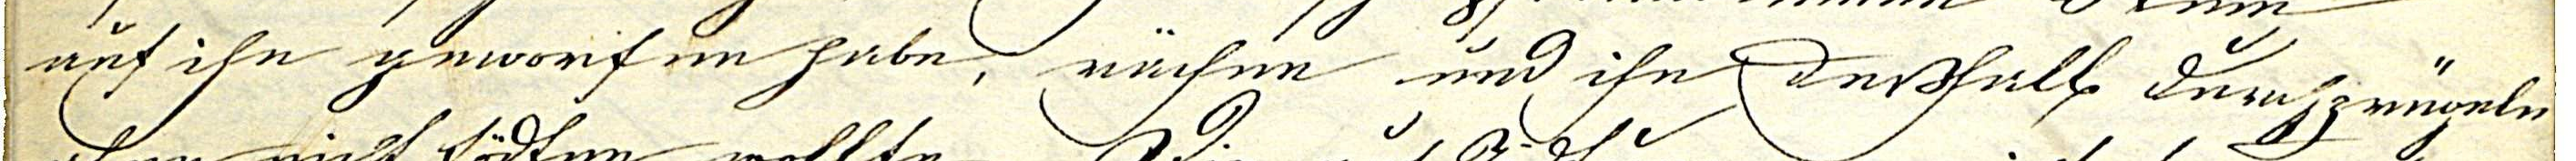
auf ihn geworfen habe, rächen und ihn deßhalb durchprügeln
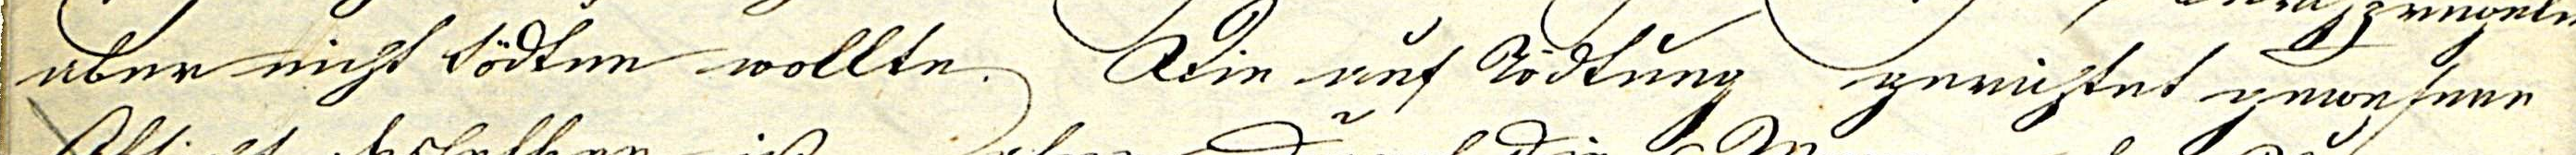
aber nicht tödten wollte. Die auf Tödtung gerichtet gewesene
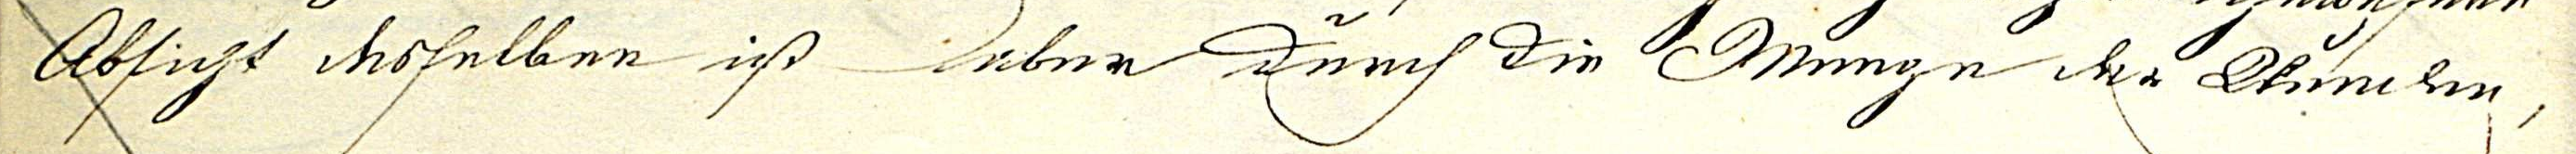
Absicht desselben ist aber durch die Menge der Wunden,
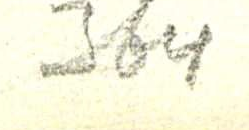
364
